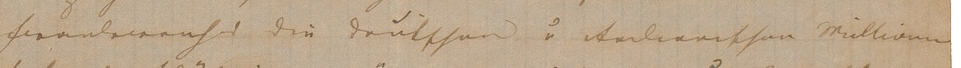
Frankreichs die deutschen u italienischen Millionen
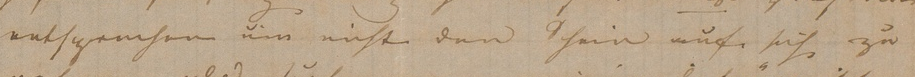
entsprechen um nicht den Schein auf sich zu
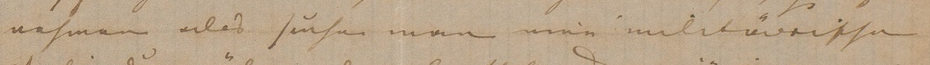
nehmen als suche man eine militärische
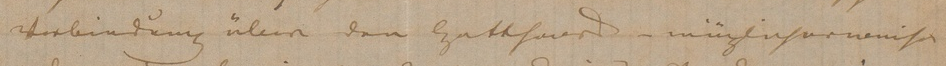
Verbindung über den Gotthard – möglicherweise
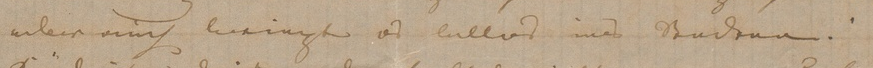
aber auch bringt es Alles ins Stoken.»
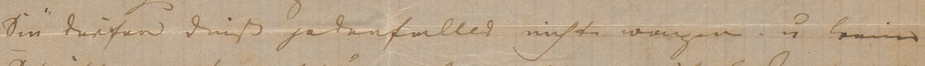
«Sie dürfen dieß jedenfalls nicht wagen – u keinen
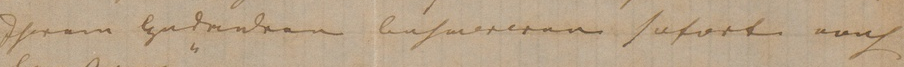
Ihrem Gedanken beharren sofort nach
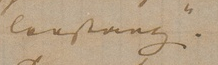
Constanz».
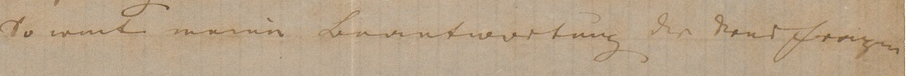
So weit meine Beantwortung der drei Fragen
